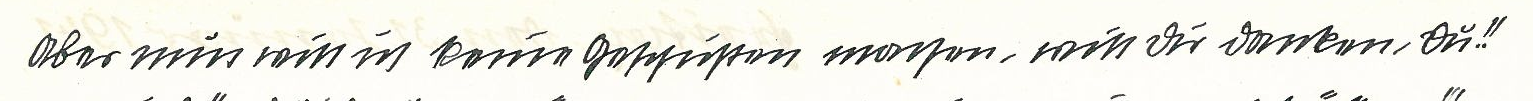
Aber nun will ich keine Geschichten machen, will Dir danken, Du!!
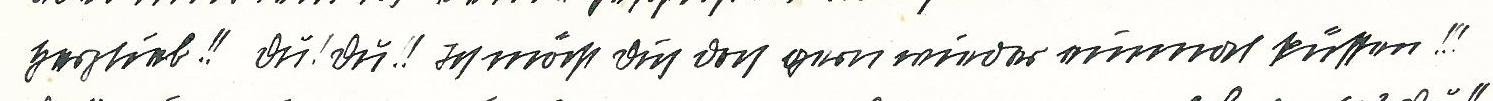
Herzlieb!! Du! Du!! ich möchte Dich doch gern wieder einmal küssen!!!
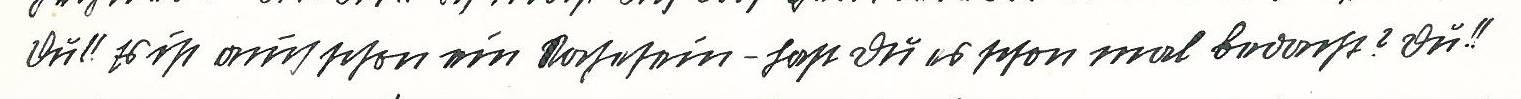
Du!! Es ist auch schon ein Nahesein – hast Du es schon mal bedacht? Du!!
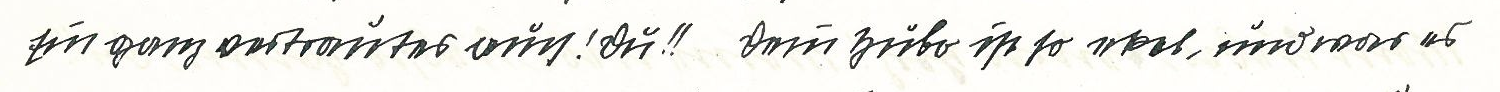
Ein ganz vertrautes auch! Du!! Dein Hubo ist so ekel, und war es
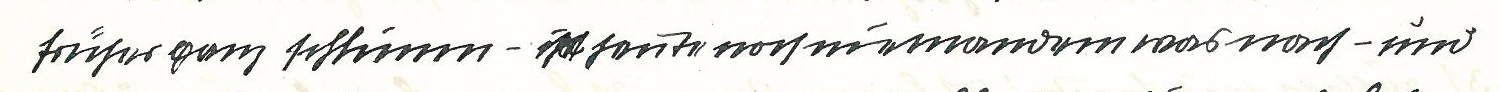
früher ganz schlimm – ist heute noch niemandem was nach – und
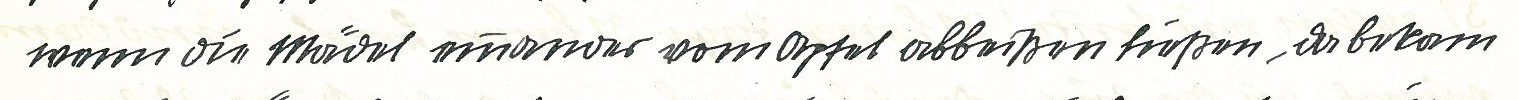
wenn die Mädel einander vom Apfel abbeißen ließen, da bekam
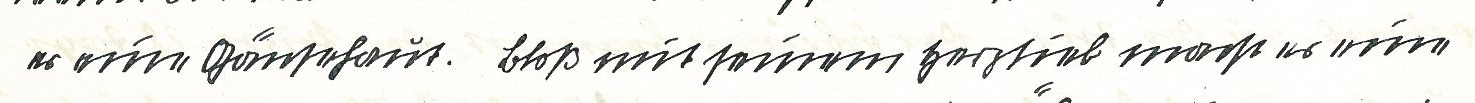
er eine Gänsehaut. Bloß mit seinem Herzlieb macht er eine
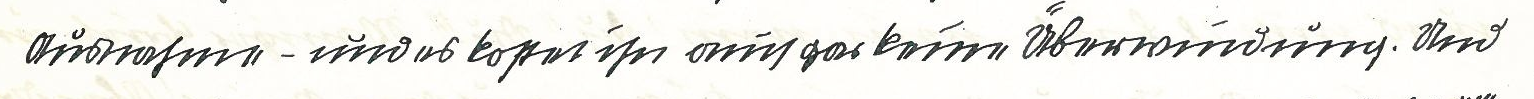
Ausnahme – und es kostet ihn auch gar keine Überwindung. Und
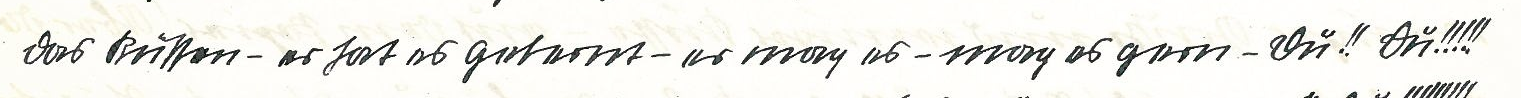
das Küssen – er hat es gelernt – er mag es – mag es gern – Du!! Du!!!!!
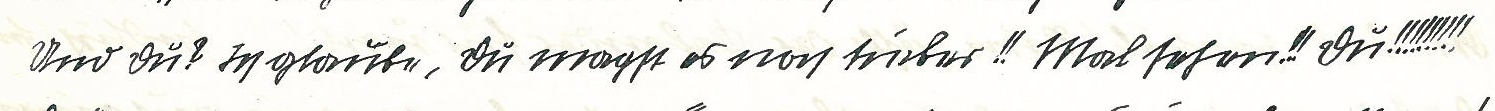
Und Du? Ich glaube, Du magst es noch lieber!! Mal sehen!!! Du!!!!!!!!!
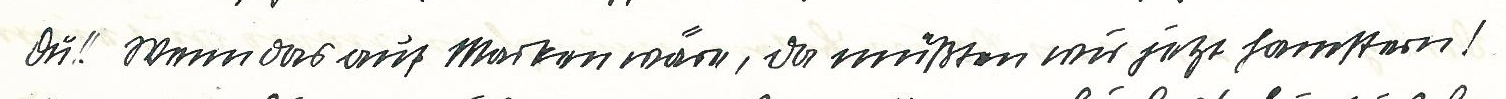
Du!! Wenn das auf Marken wäre, da müßten wir jetzt hamstern!
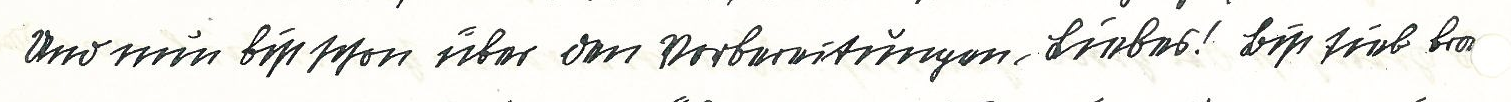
Und nun bist schon über den Vorbereitungen, Liebes! Bist lieb bra
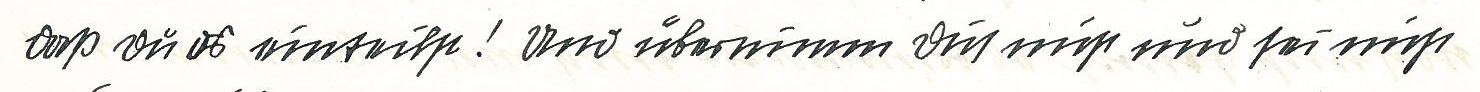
daß Du es einteilst! Und übernimm Dich nicht und sei nicht
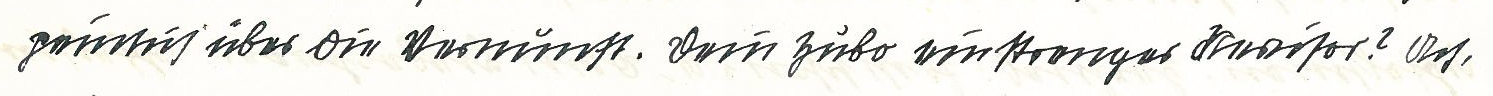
peinlich über die Vernunft. Dein Hubo ein strenger Revisor? Ach,
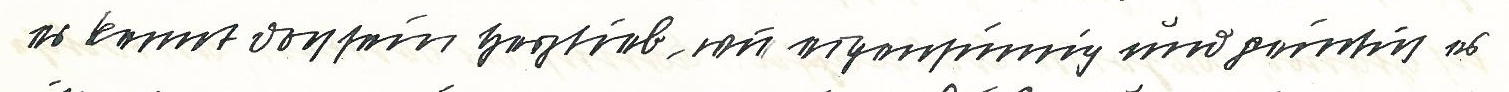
er kennt doch sein Herzlieb, wie eigensinnig und peinlich es
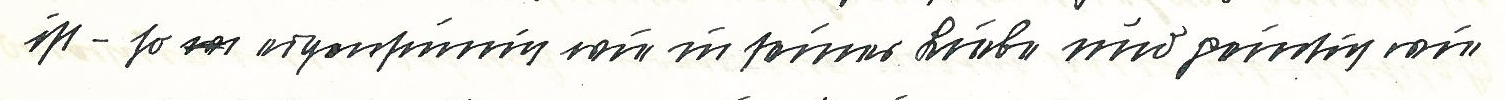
ist – so seh eigensinnig wie in seiner Liebe und peinlich wie
